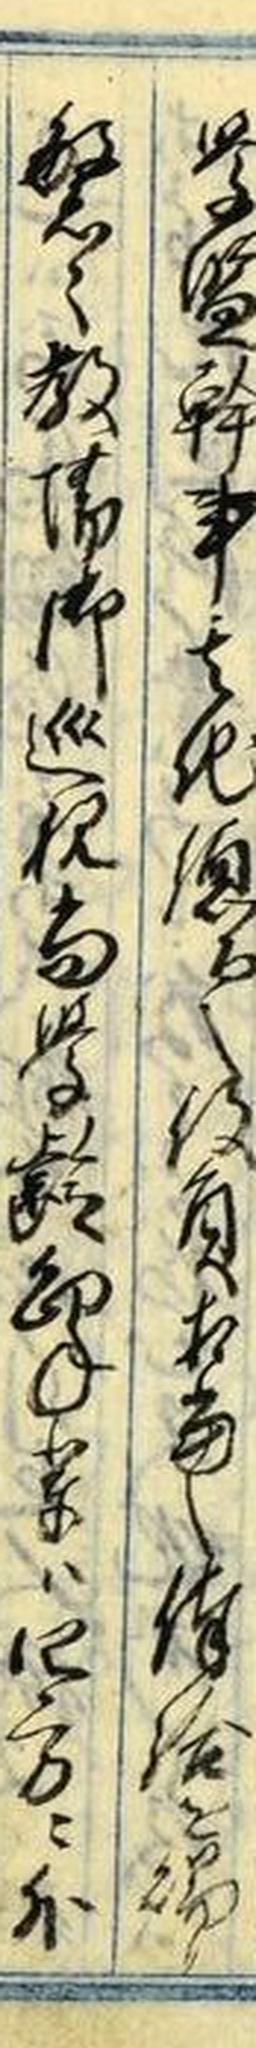繁々教場御巡視尚学齢幼年輩ハ四方ニ外
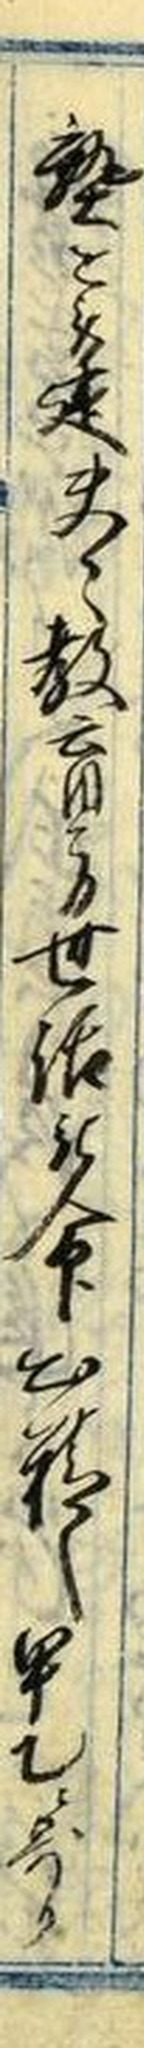塾を被建夫々教育方世話被命出精之甲乙ニ寄り

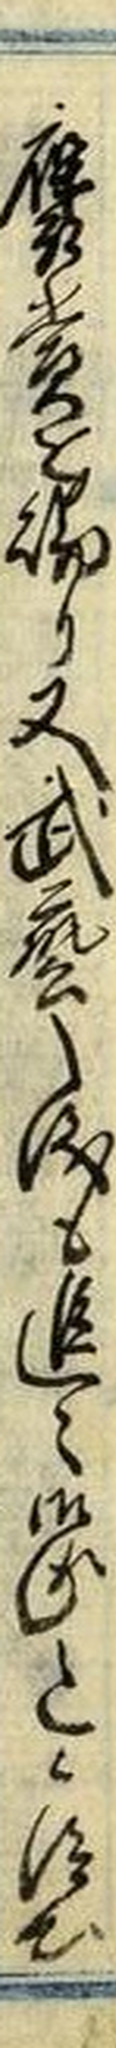褒賞を賜り又武芸之儀も追々御趣意被仰出
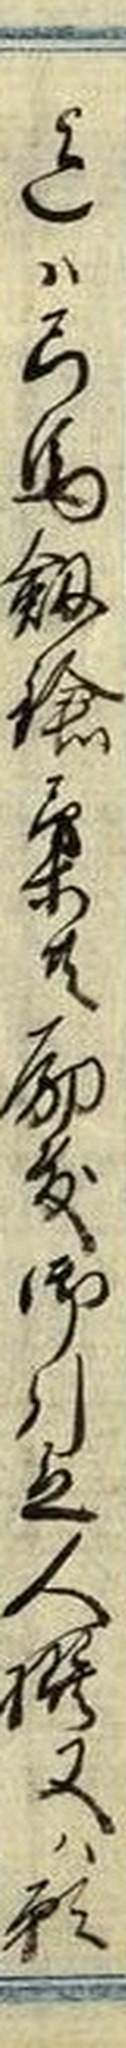迄ハ弓馬剣鎗柔共励敷御引立人撰又ハ願
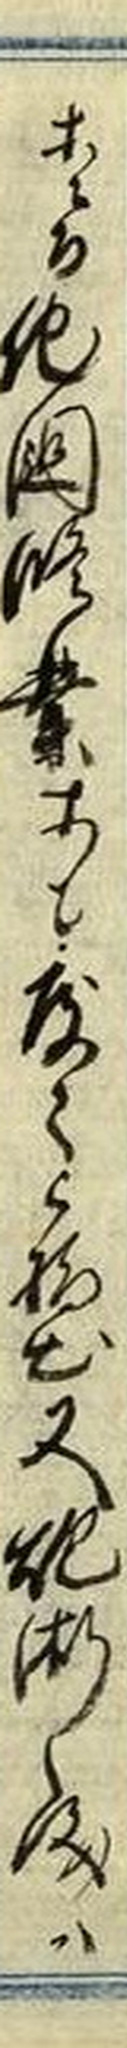等ニ而他国修業等も度々被指出又炮術之儀ハ
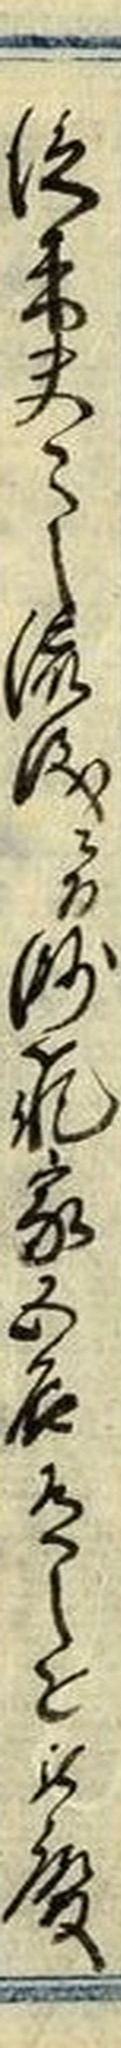従来夫々之流儀ニ而師範家五名有しを被廃
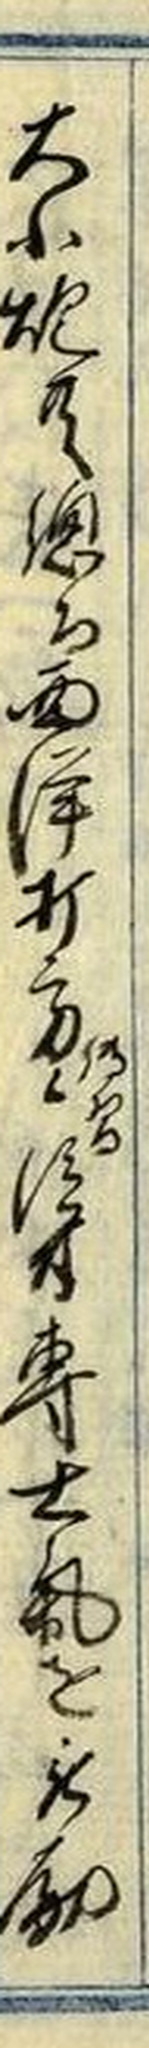大小炮共総而西洋打方伝習被仰付専士気を被励
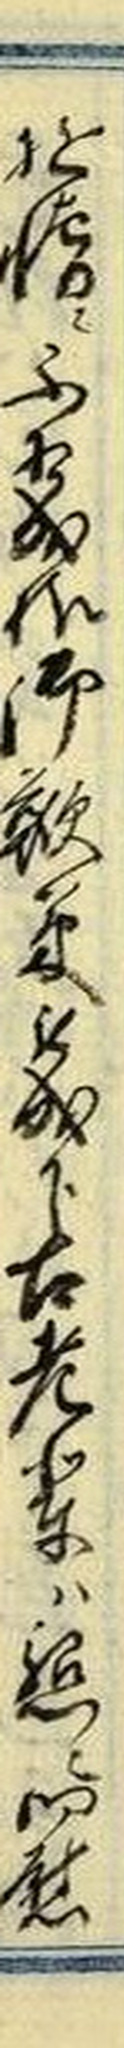遊惰ニ不相成様御鞭策被成下古老輩ハ懇ニ御慰
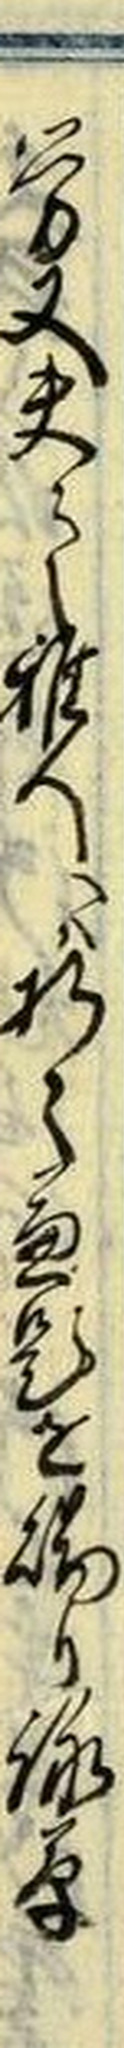労又夫々之雅人へハ折々兼題を賜り詠草
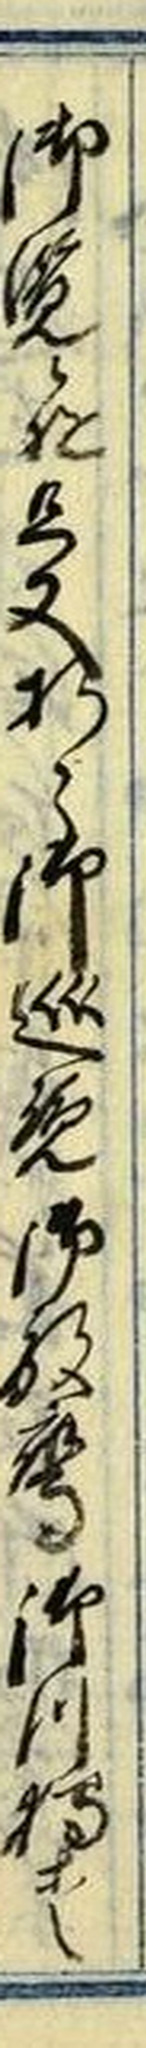御覧被遊且又折々御巡覧御放鷹御川狩等之
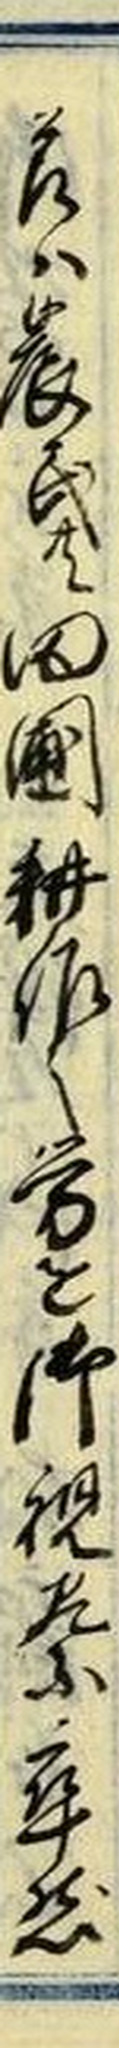節ハ農民共田圃耕作之労を御視察卒然
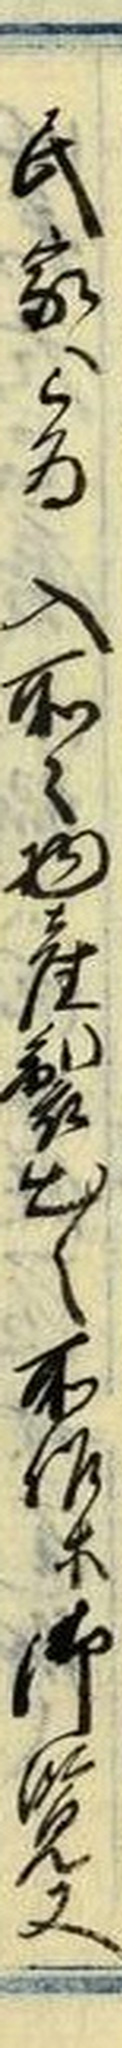民家へ被為入所之物産製出之所作等御覧又
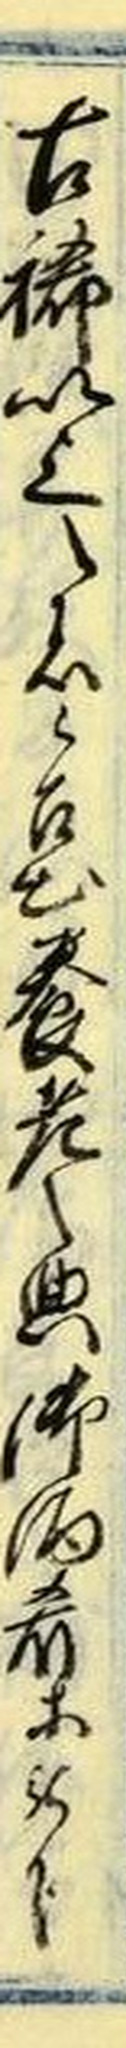古稀以上之者被召出養老之典御酒肴等被下
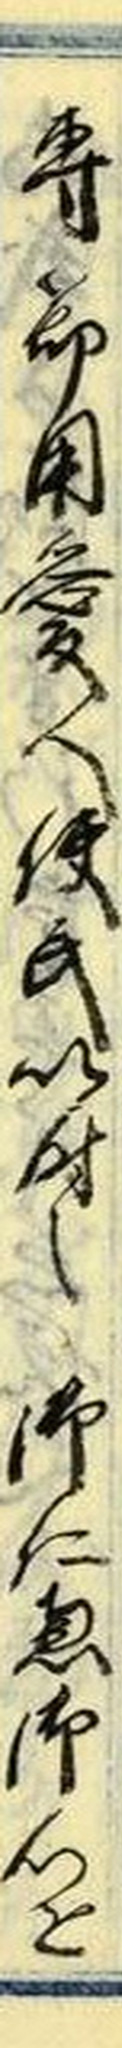専節用愛人使民以時之御仁恵御心を
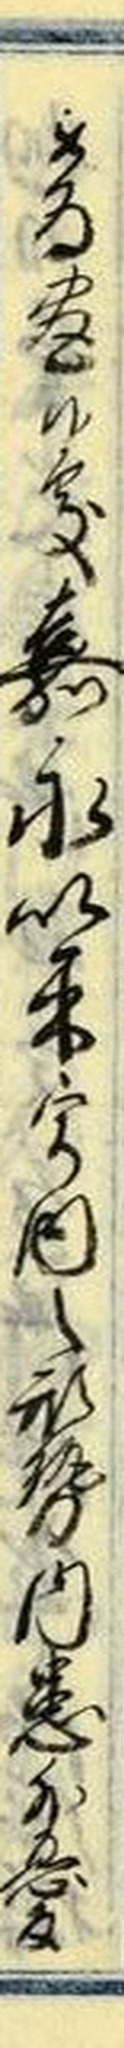被為尽候処嘉永以来宇内之形勢内患外憂
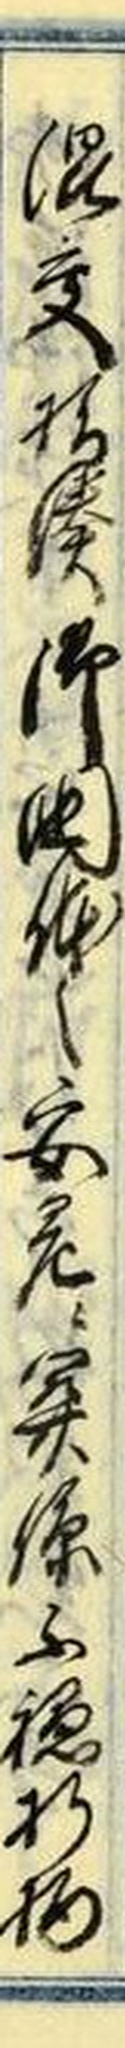混交指湊御国体之安危ニ関係不穏折柄
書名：温古集 三巻
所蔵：福井県文書館 Fukui Prefectural Archives
